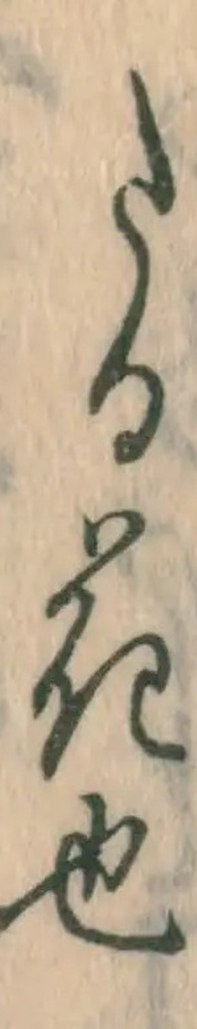たる花也
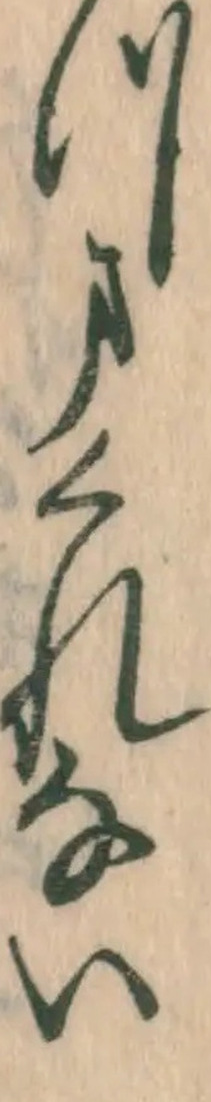さつまくれない
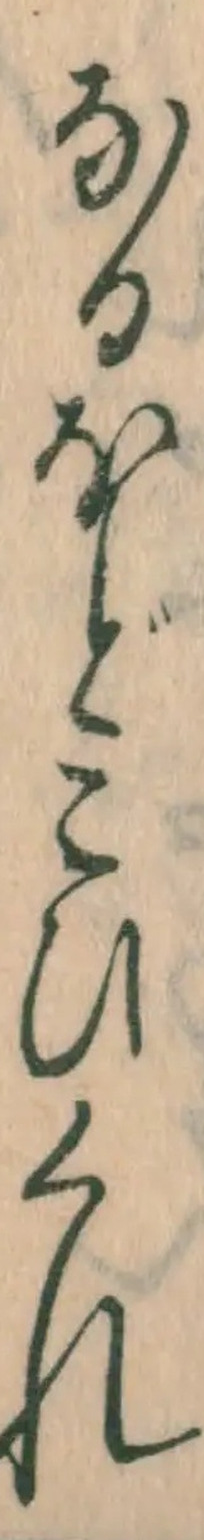なるほどこひくれ
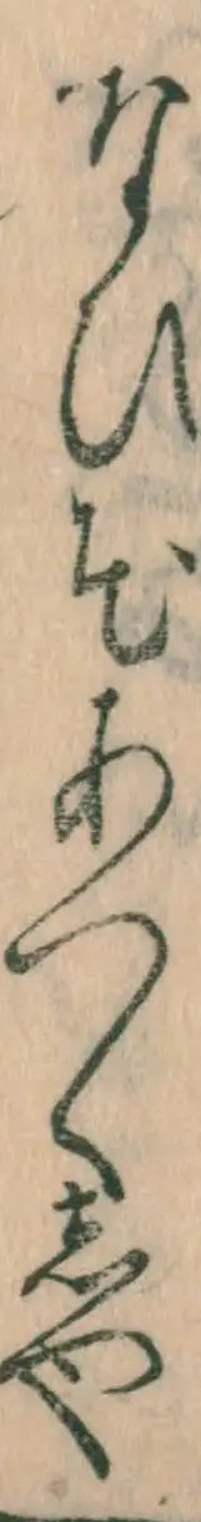ない花あつくしや
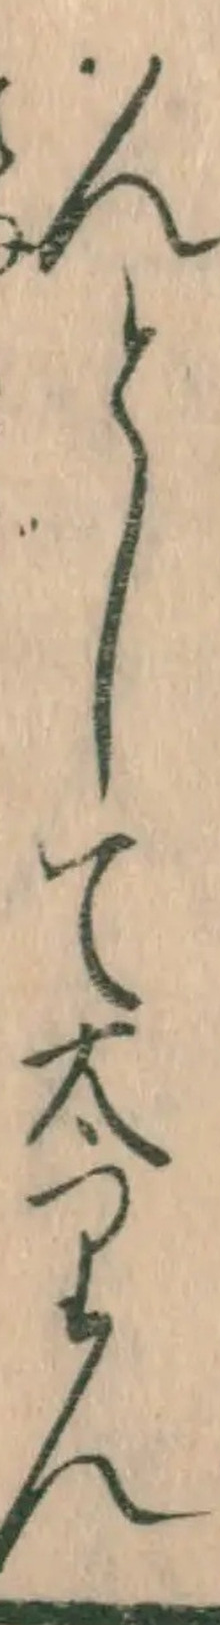んとして太りん
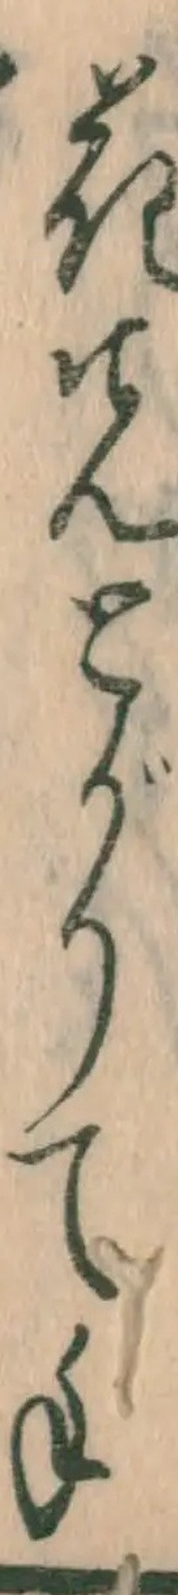花先とがりてね
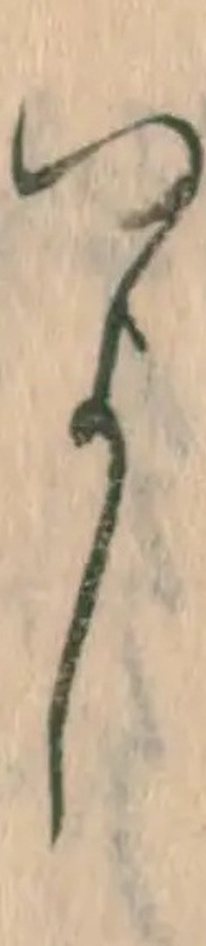つよし
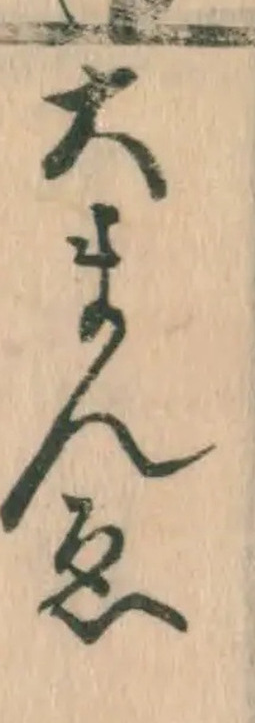大まんゑ
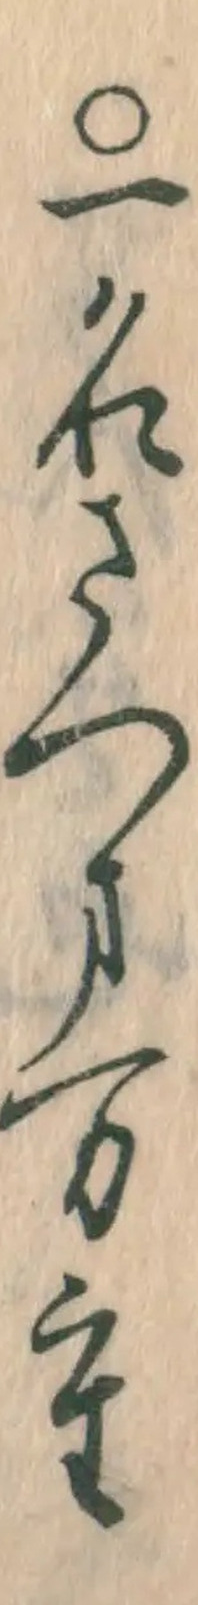○一名さつま万重
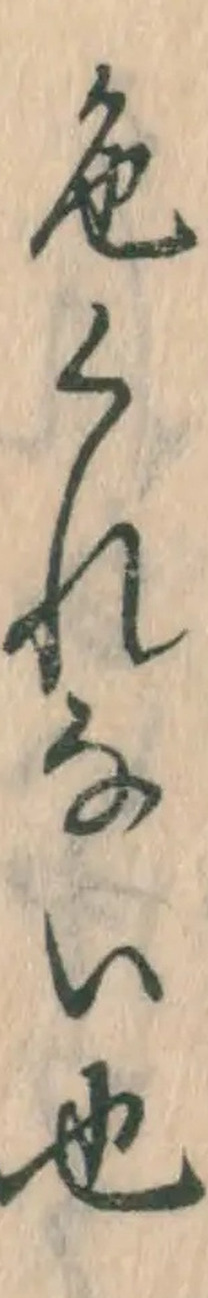色くれない也

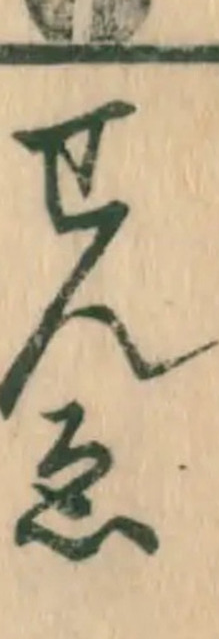せんゑ
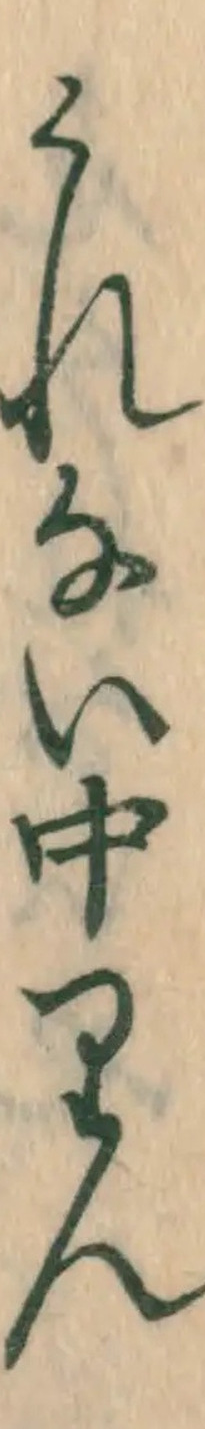くれない中りん
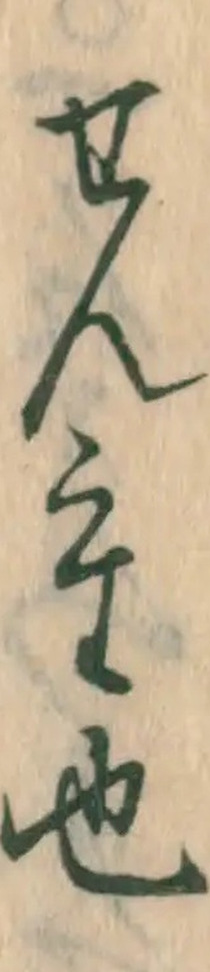せん重也
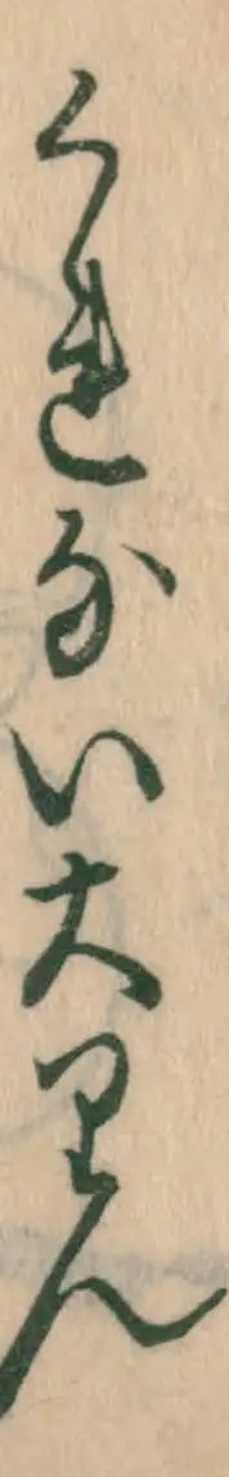くれない大りん
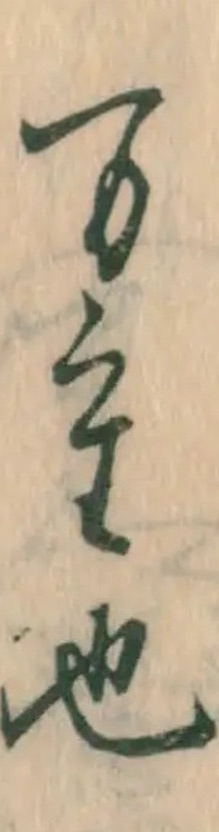万重也
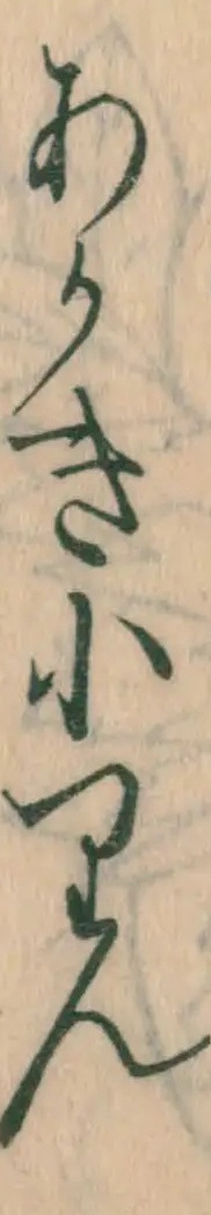あかき小りん
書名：錦繍枕 5巻. [4]
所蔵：国立国会図書館 National Diet Library, JAPAN
